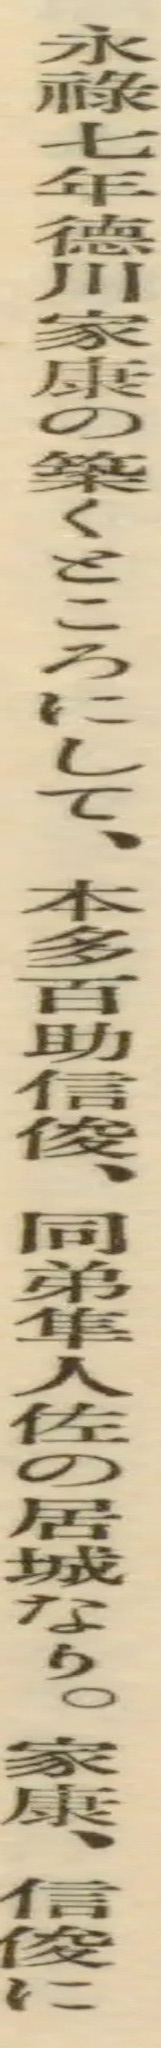永禄七年徳川家康の築くところにして、本多百助信俊、同弟隼人佐の居城なり。家康、信俊に
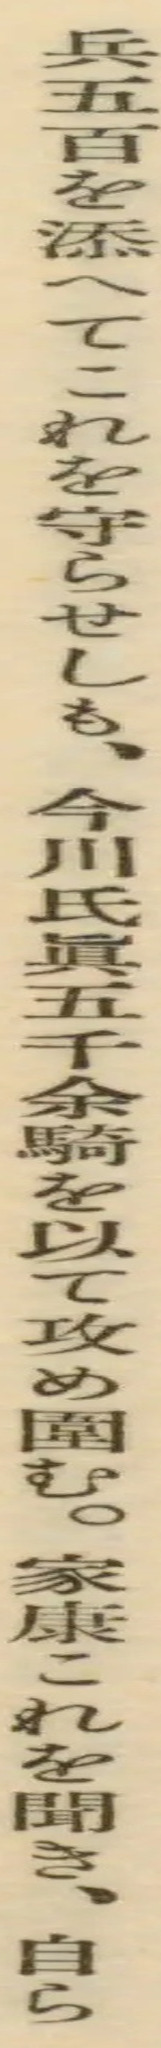兵五百を添へてこれを守らせしも、今川氏眞五千余騎を以て攻め囲む。家康これを聞き、自ら
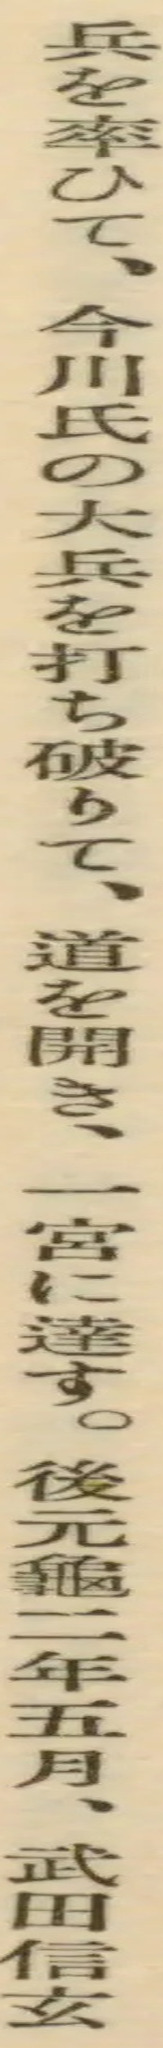兵を率ひて、今川氏の大兵を打ち破りて、道を開き、一宮に達す。後元亀二年五月、武田信玄
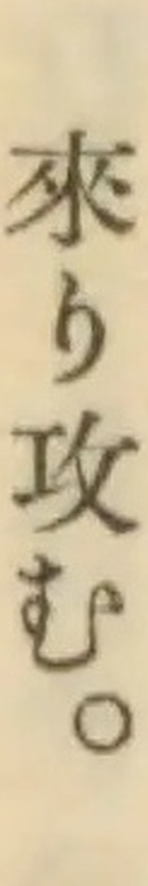来り攻む。
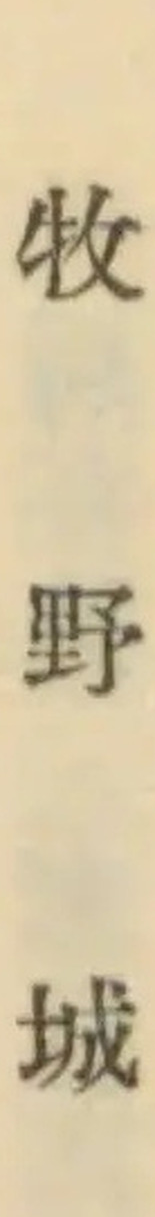牧野城
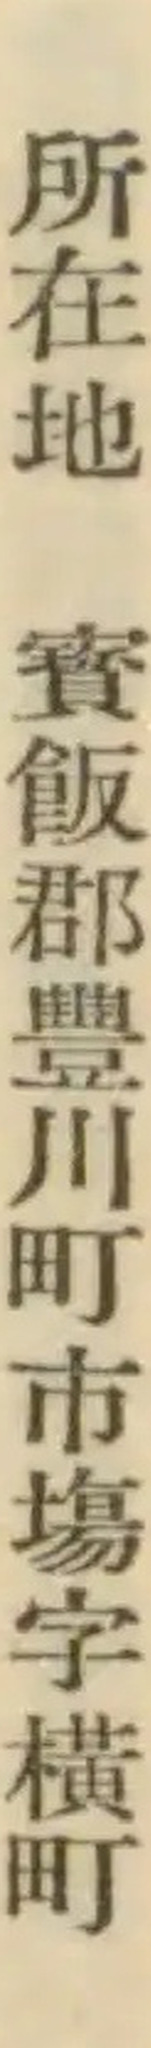所在地宝飯郡豊川町市場字横町
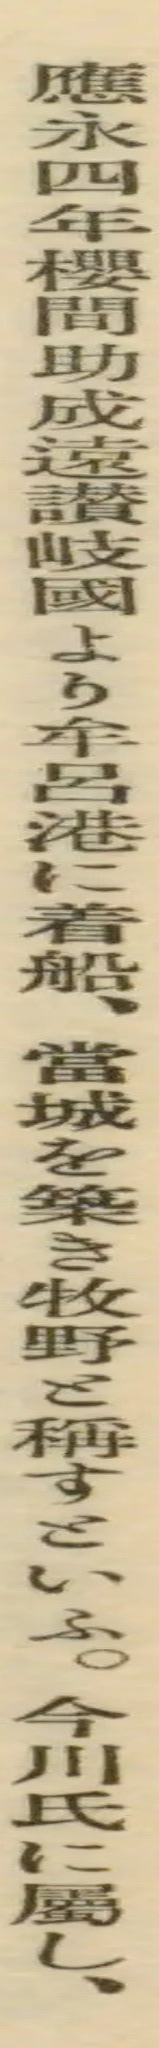応永四年桜間助成遠讃岐国より牟呂港に着船、当城を築き牧野と称すといふ。今川氏に属し、
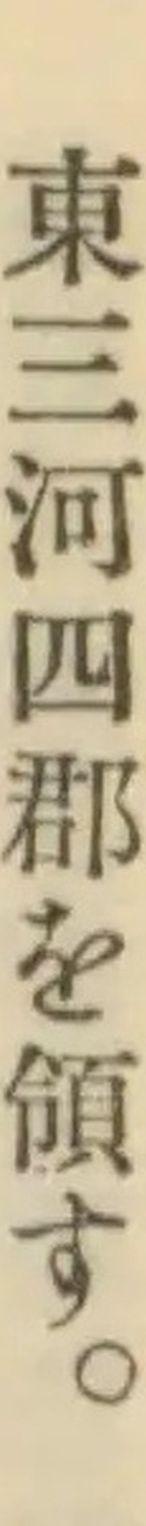東三河四郡を領す。
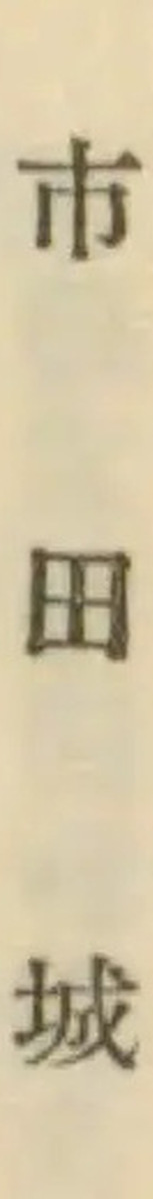市田城
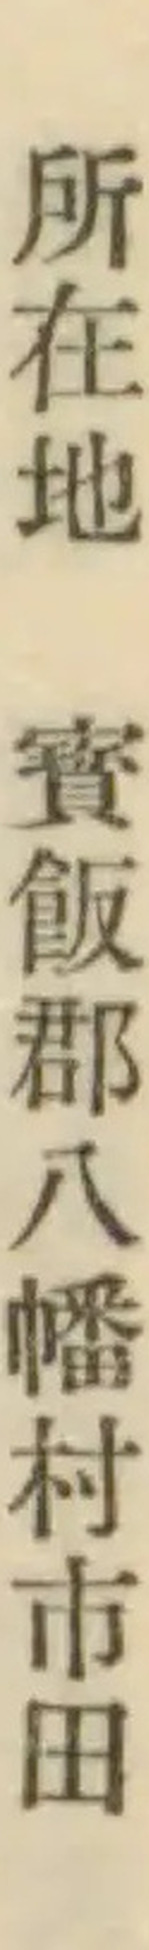所在地宝飯郡八幡村市田
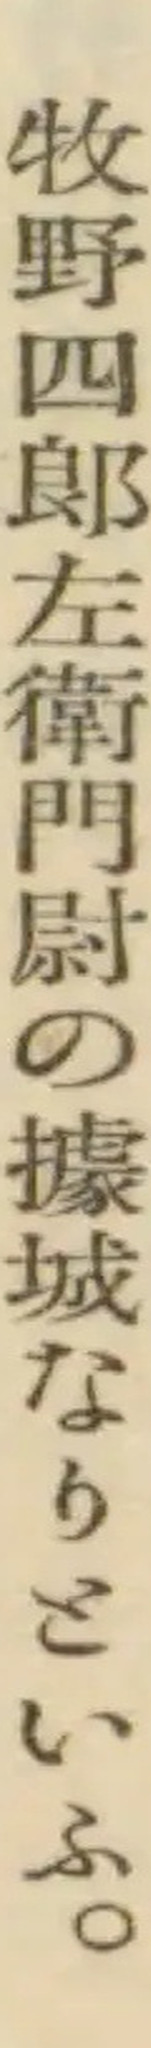牧野四郎左衛門尉の拠城なりといふ。
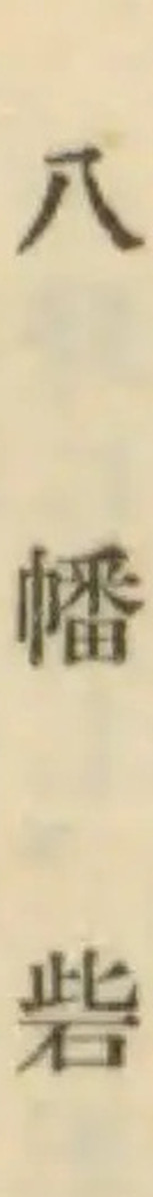八幡砦
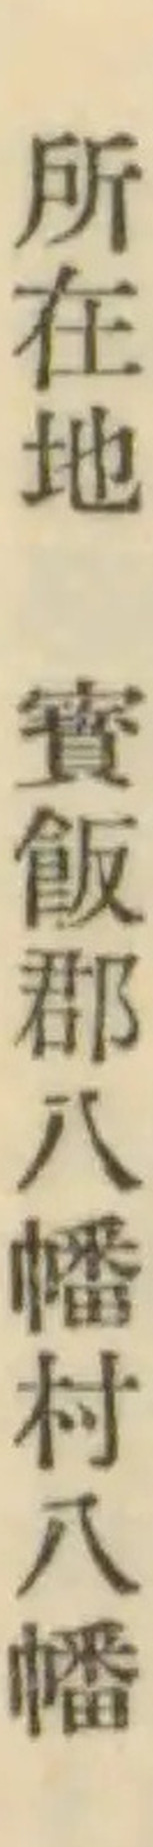所在地宝飯郡八幡村八幡
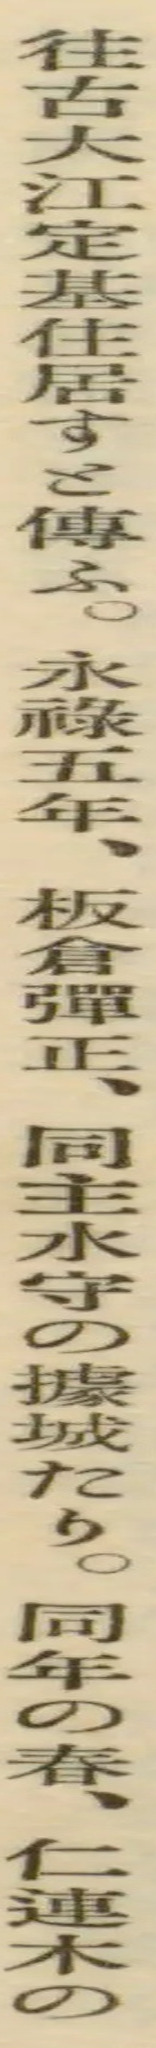往古大江定基住居すと伝ふ。永禄五年、板倉弾正、同主水守の拠城たり。同年の春、仁連木の
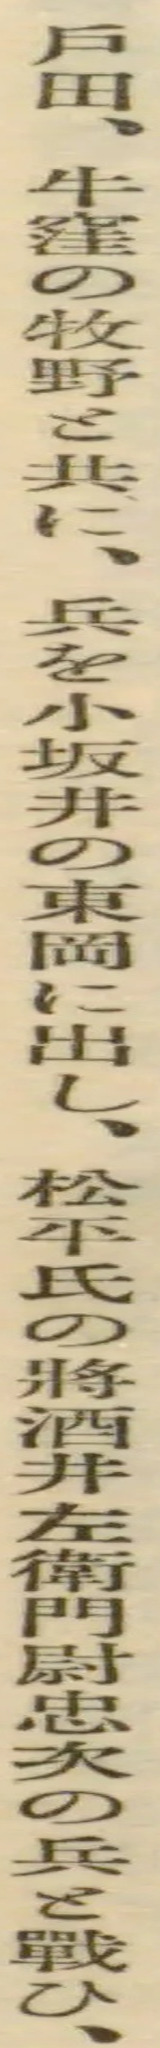戸田、牛窪の牧野と共に、兵を小坂井の東岡に出し、松平氏の将酒井左衛門尉忠次の兵と戦ひ、
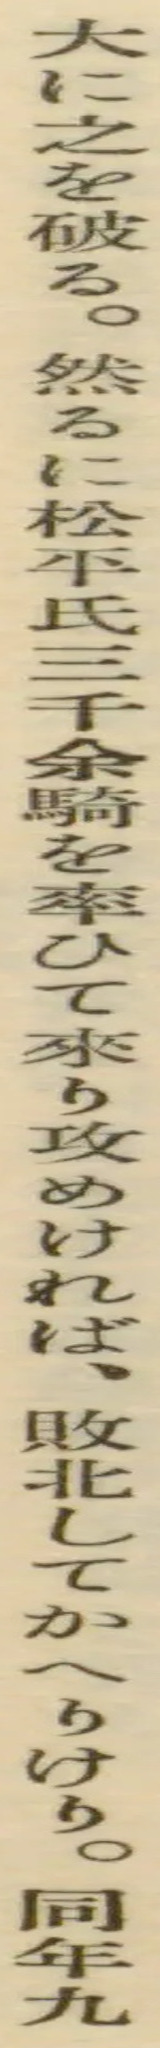大に之を破る。然るに松平氏三千余騎を率ひて来り攻めければ、敗北してかへりけり。同年九
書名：東三河之古城
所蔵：国立国会図書館 National Diet Library, JAPAN
